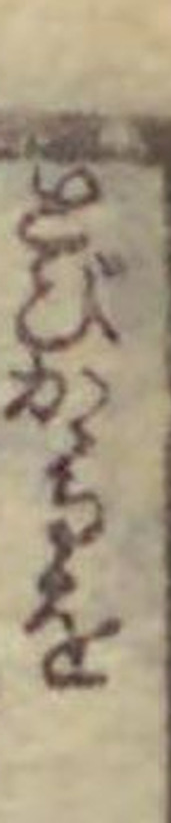とびかゝるを
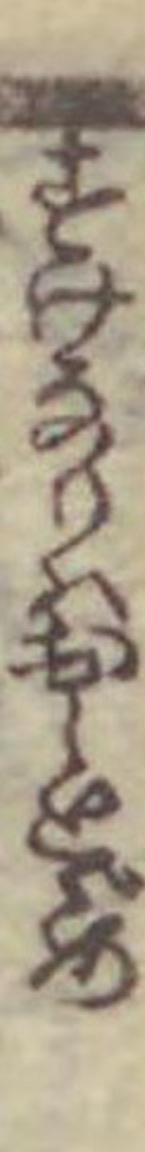すけなりはおしとゞめ
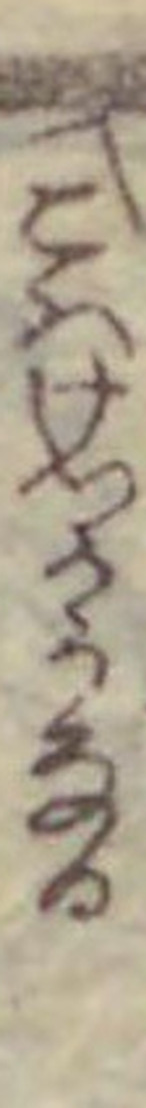〽こはけつこうなる
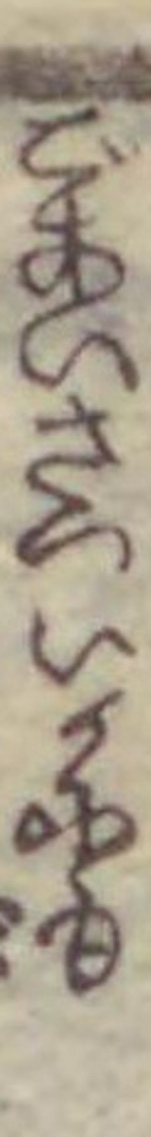ごあいさついかにも
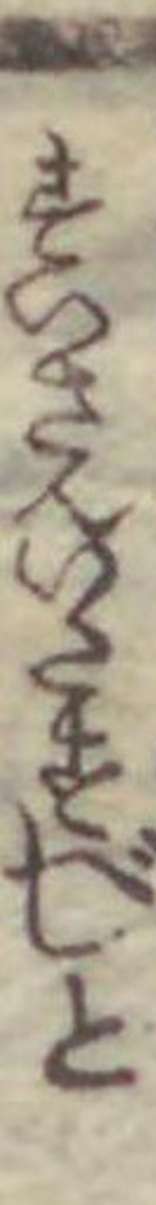すいさんいたすべしと
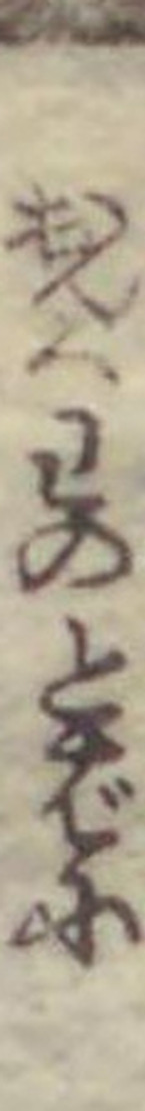おんくわのとばに
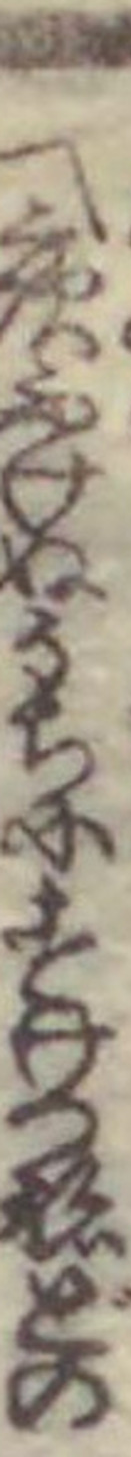〽夜ふけぬうちにすけつねどの
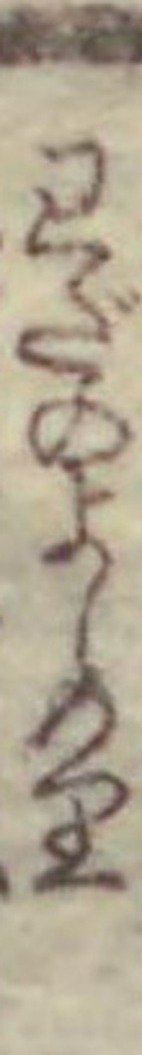わだのよしもり
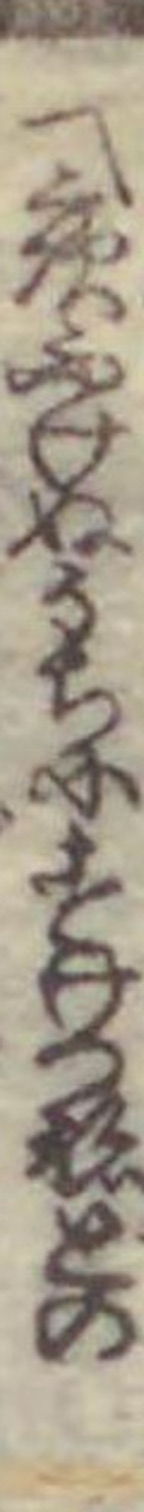〽夜ふけぬうちにすけつねどの
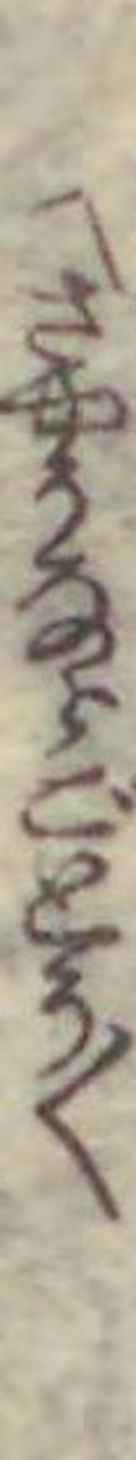〽さようならごとう〳〵
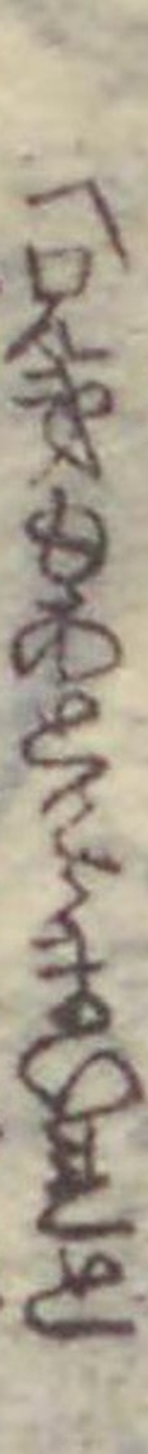〽兄弟もあとからまいれと
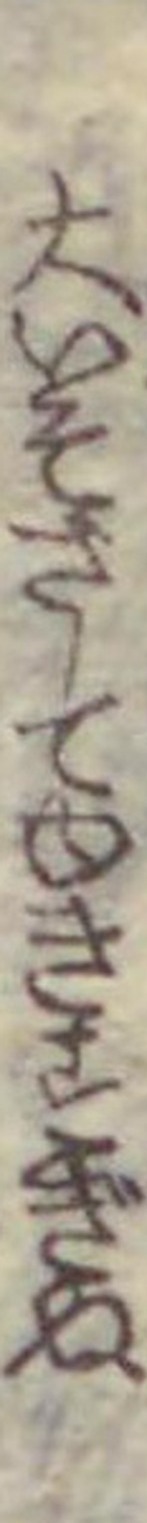大いそさしてゆきすぎぬ
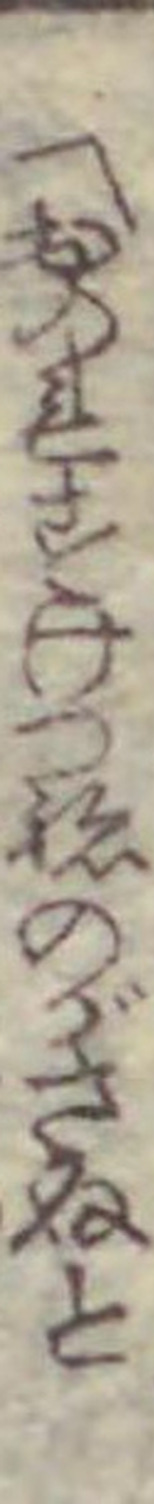〽おのれすけつねのがさぬと
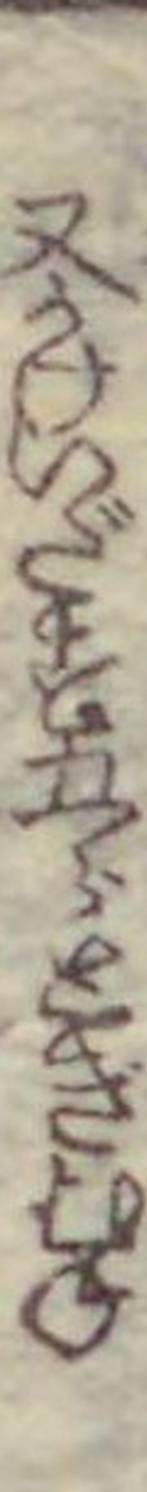又かけいだす五郎ときむね
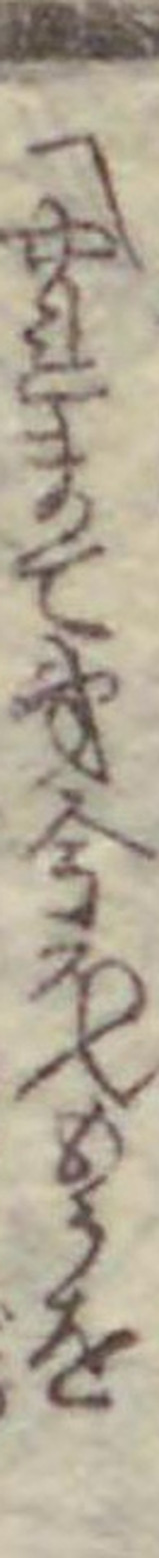〽やれまて弟今ほんもうを
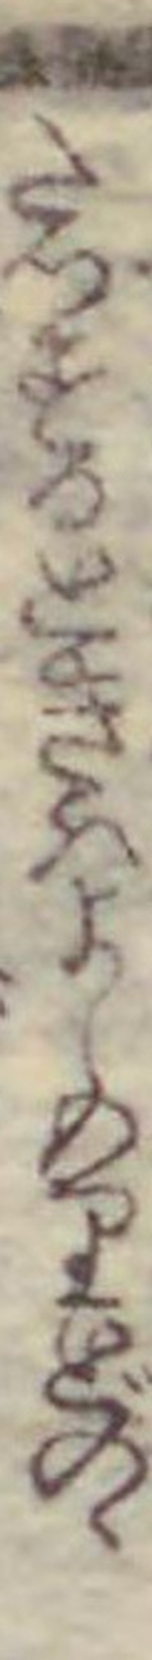たつするときはよしもりどのゝ
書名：大時代唐土化物 3巻. 曽我太夫染
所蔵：国立国会図書館 National Diet Library, JAPAN
